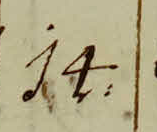14:
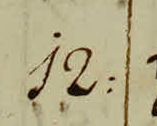12:
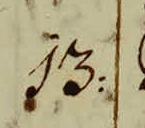13:
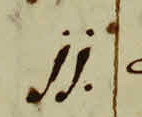11.
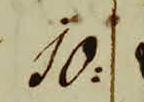10:
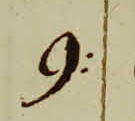9:
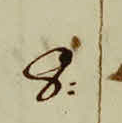8:
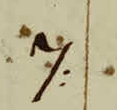7:
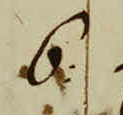6:
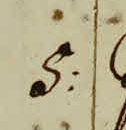5:
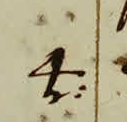4:
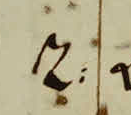2:
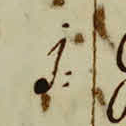1:
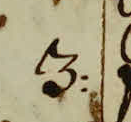3:
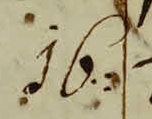16:
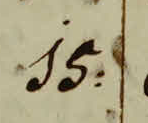15:
